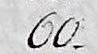60
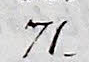71
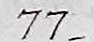77
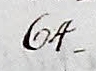64
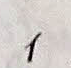1
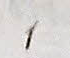1
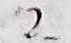2
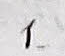1
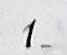1
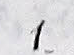1
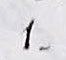1
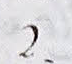2
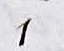1
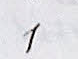1
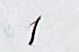1
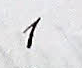1
